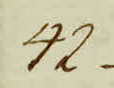42
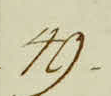49
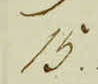15
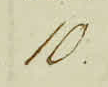10
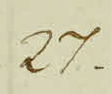27
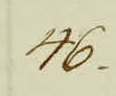46
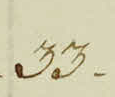33
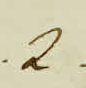2
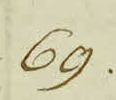69
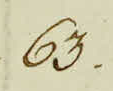63
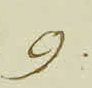9
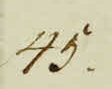45
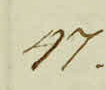47
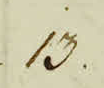13
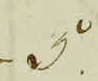5
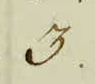3
